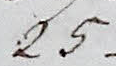25
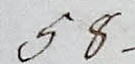58
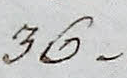36
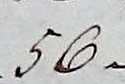56
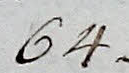64
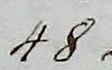48
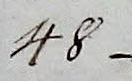48
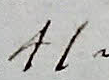41
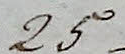25
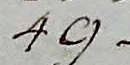49
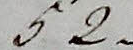52
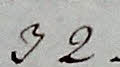32
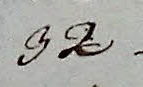32
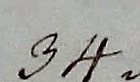34
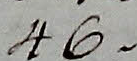46
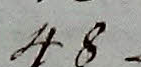48
